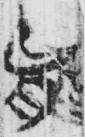能
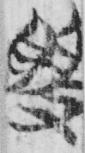受
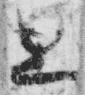也
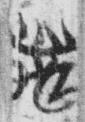萬
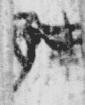邦
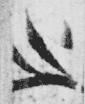之
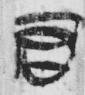君
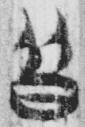皆
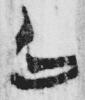㠯（以）
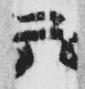亓（其）
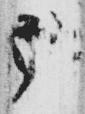邦
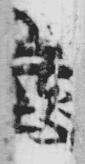襄（讓）
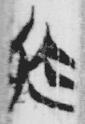於
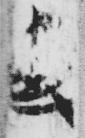臤（賢）
